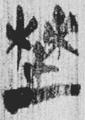埜
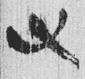又（有）
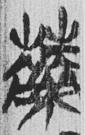○（蔬）
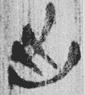出
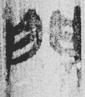門
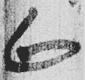㠯（以）
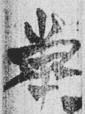東
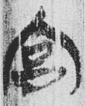宫
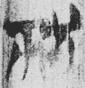祝
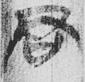君
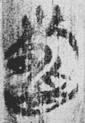壽
